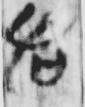左
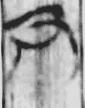尹
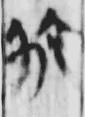{力它}
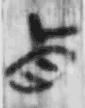貞
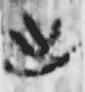出
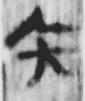內（入）
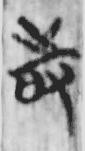○（侍）
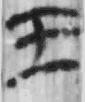王
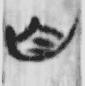自
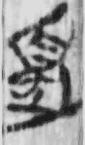○（夏）
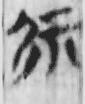𫵖
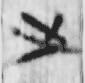之
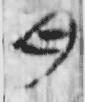月
